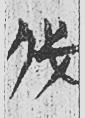伐
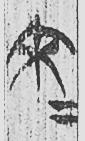宋=
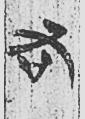右
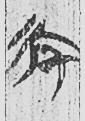帀
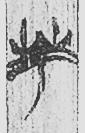芋
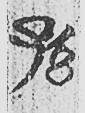孫
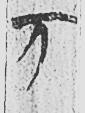兀
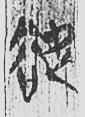欲
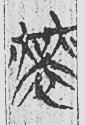{炎衣}
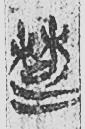楚
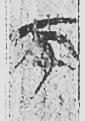帀
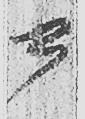乃
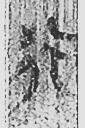行
